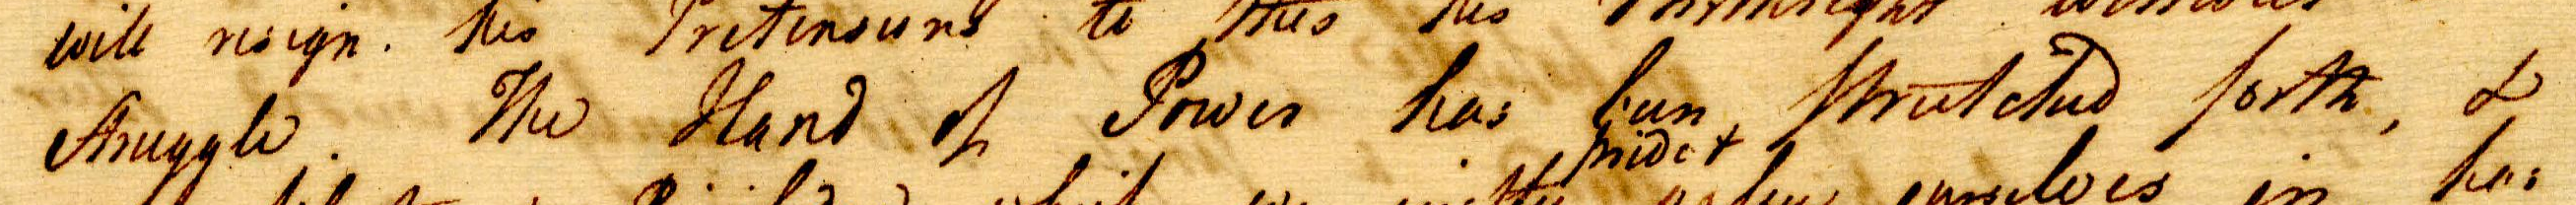Struggle. The Hand of Power has been Stretched forth, &
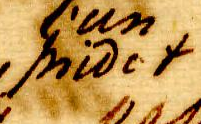pride &
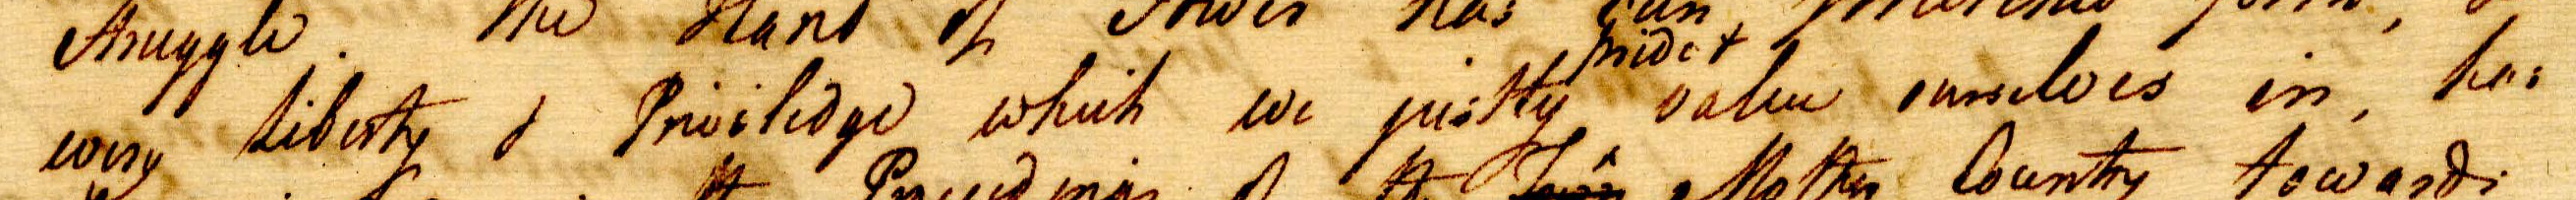every Liberty & Priviledge, which we justly ^ value ourselves in, has
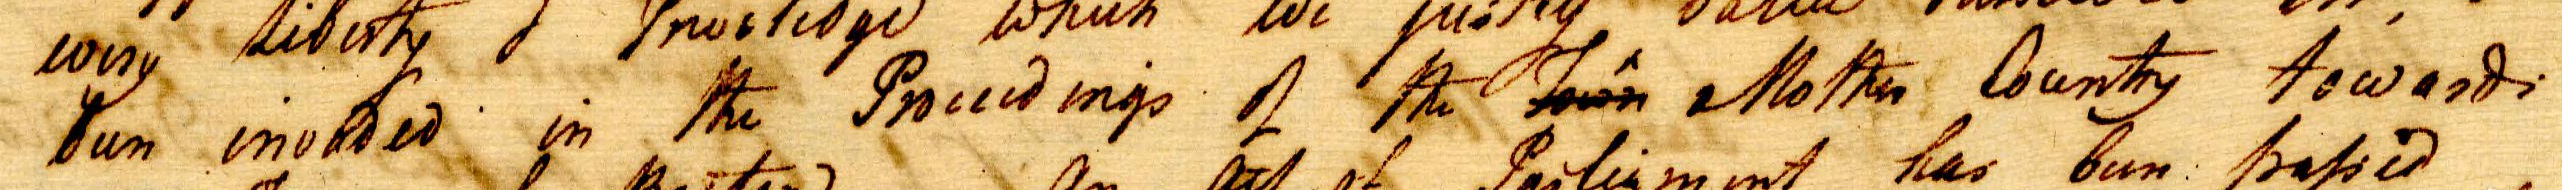Seen invaded in the Proceedings of the Town Mother Country towards
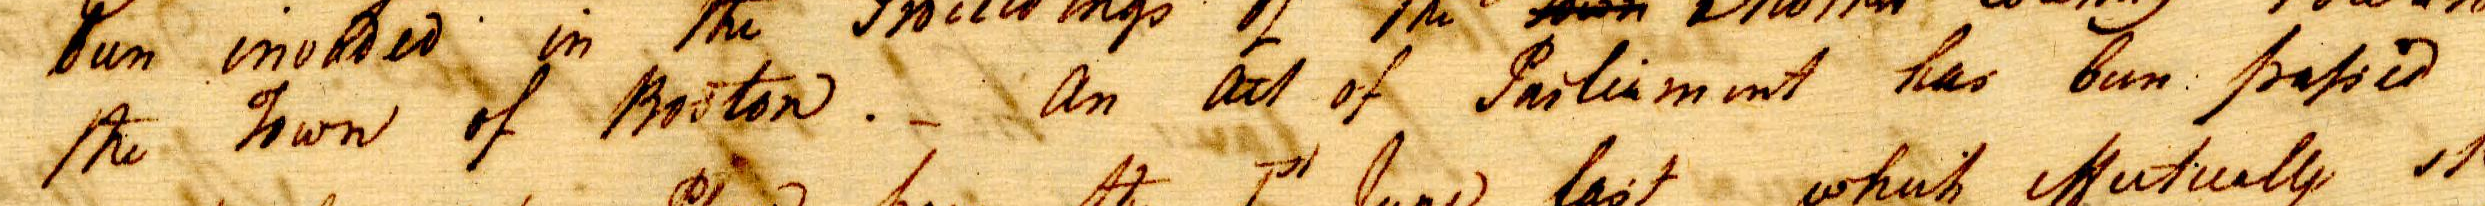the Town of Boston. An Act of Parliament has been passed
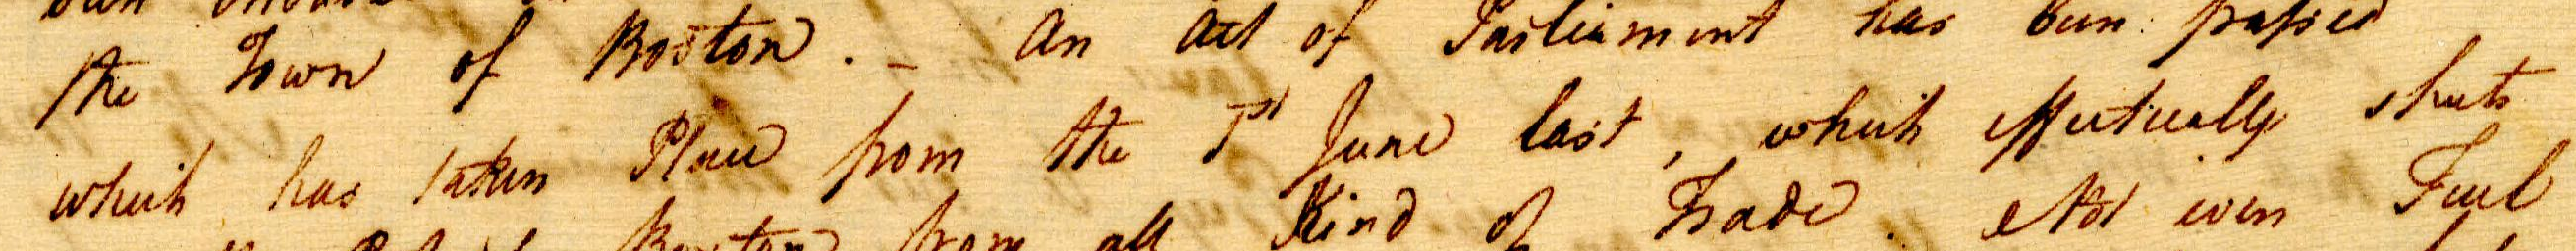which has taken Place from the 1^st June last, which effectually shut
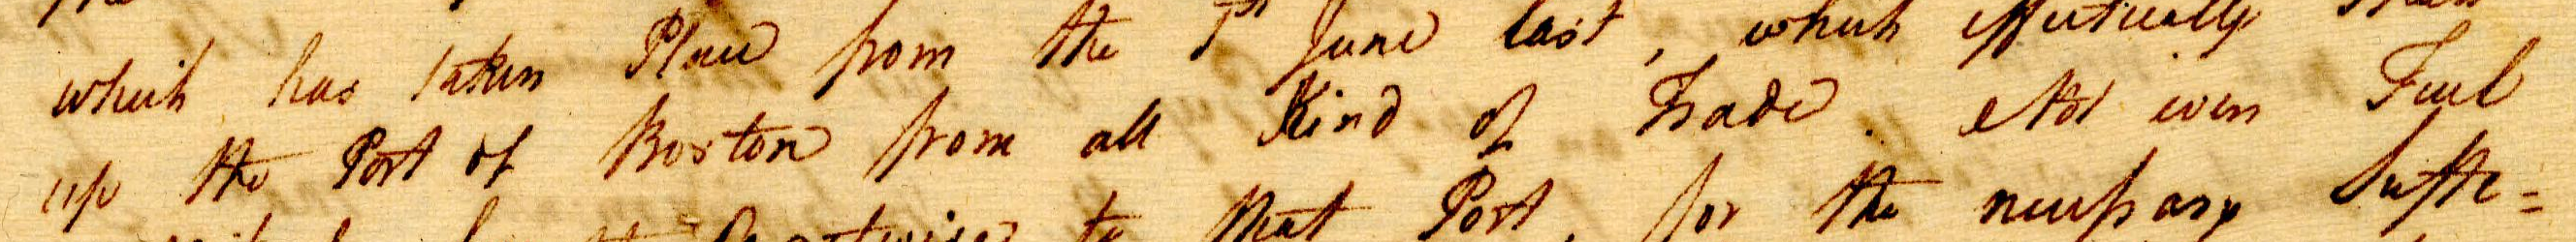up the Port of Boston from all Kind of Trade. Not even Fuel
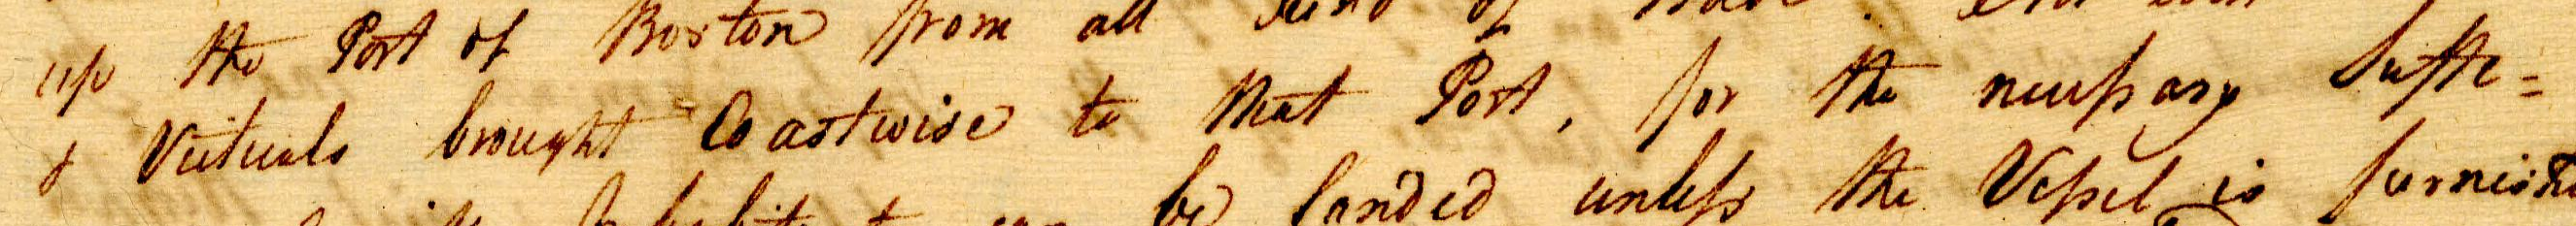& Victuals brought Coastwise to that Port, for the necessary Suste--
